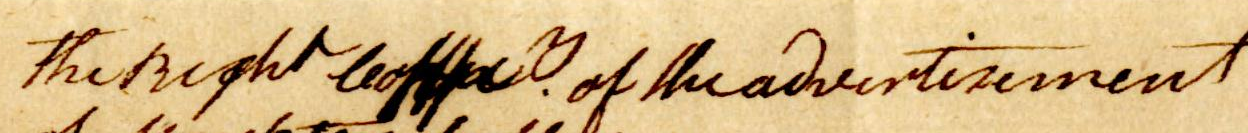the right Copp^y of the advertisement
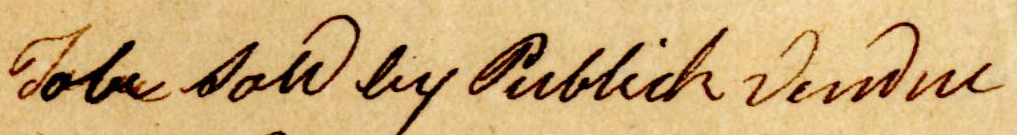To be sold by Publick Vendue
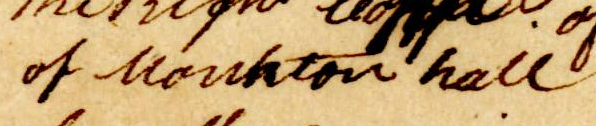of Monkton hall
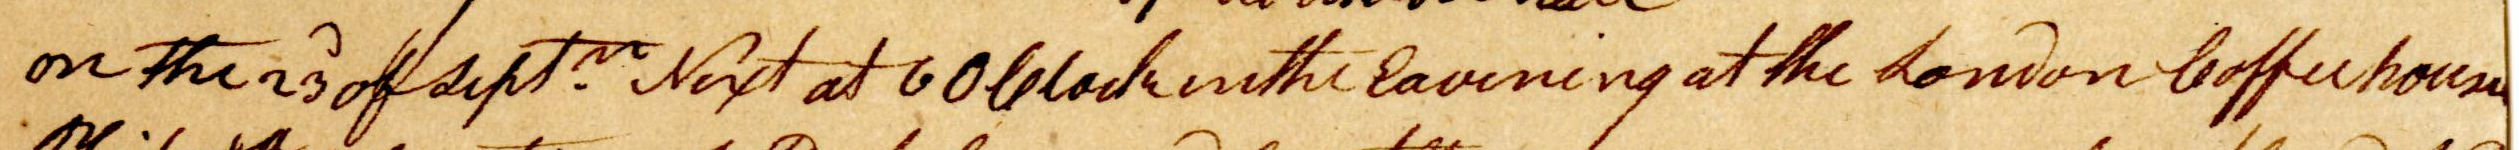on the 23^d of Sept^r. Next at 6 OClock in the Eavening at the London Coffee house
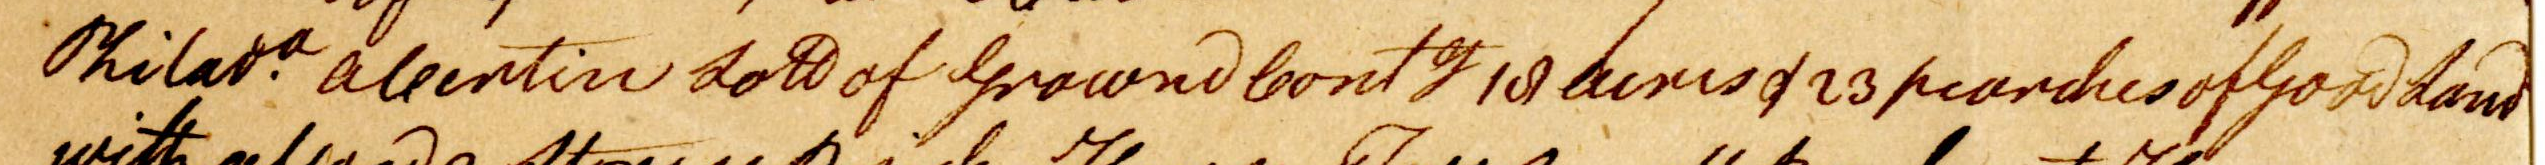Philad^a. a certain Lotd of Ground Cont^g 101 acres & 23 pearches of Good Land
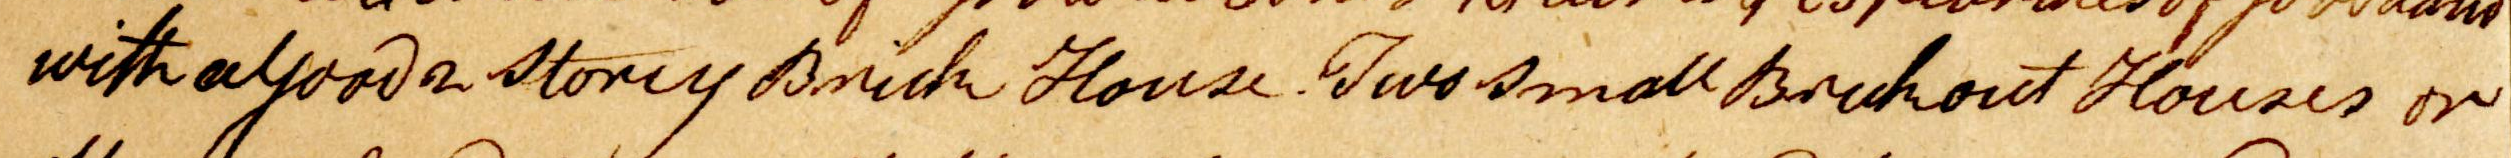with a good 2 Storey Brick House. Two small Brickout Houses or
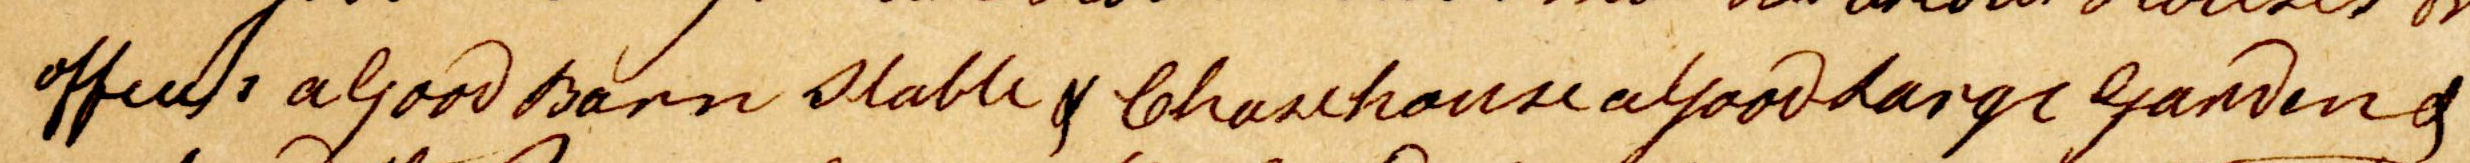offices a Good Barn stable & Chasehouse a good Large garden &
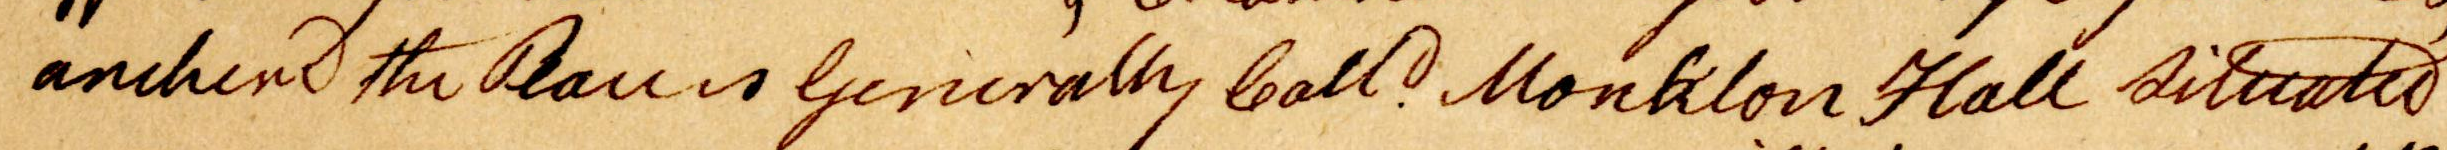anchend the Place is Generally Call^d Monkton Hall situated
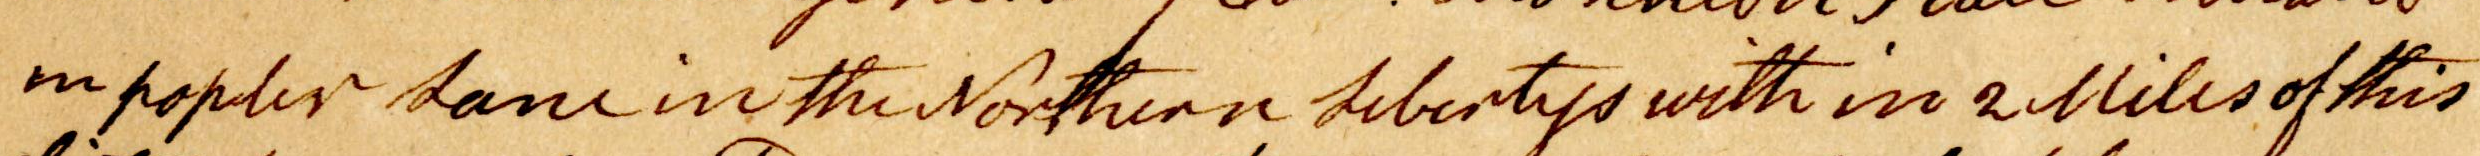in proper Lane in the Northern Libertys with in 2 Miles of this
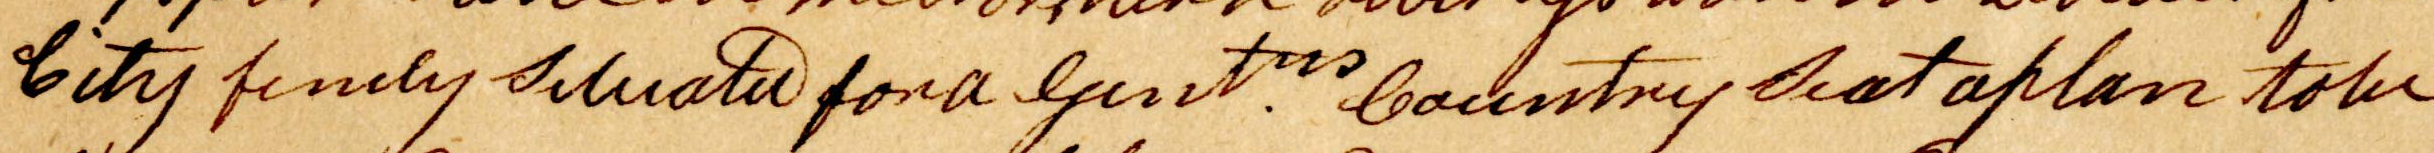City finely situated for a Gent^ns. Country Seat a plan to be
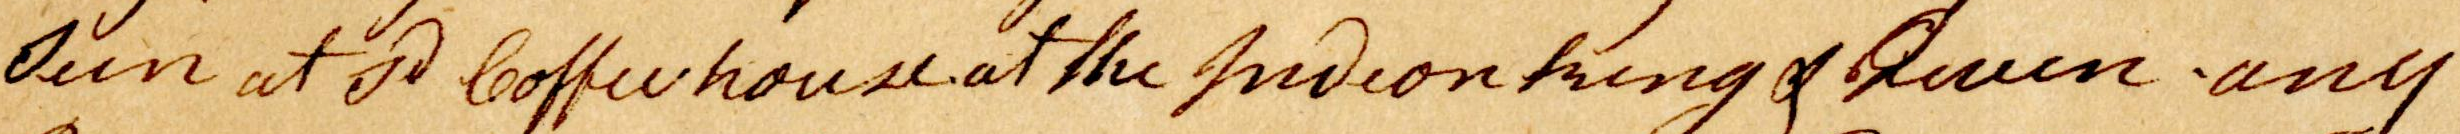seen at s^d Coffeehouse at the Indian King & Queen any
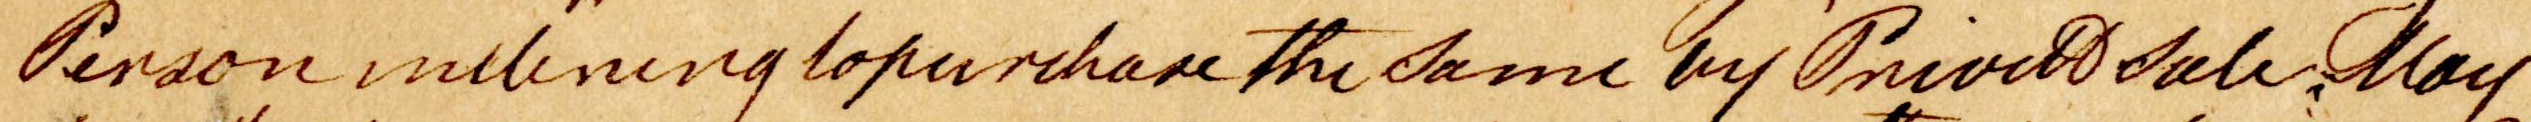Person inclining to purchase the same by Private sale May
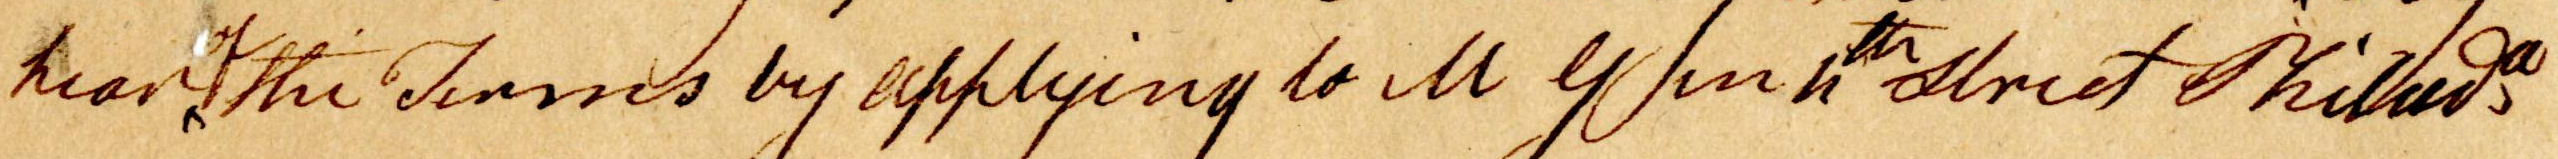hear ^of the terms by applying to M G in 4^th. Street Philad^a.
